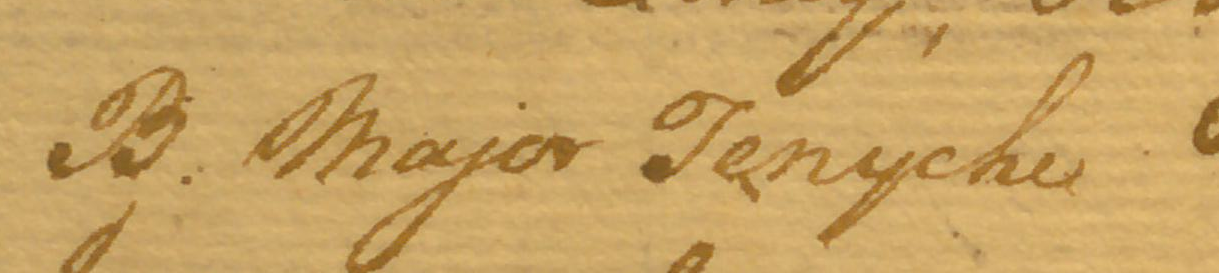B. Major Tenyche
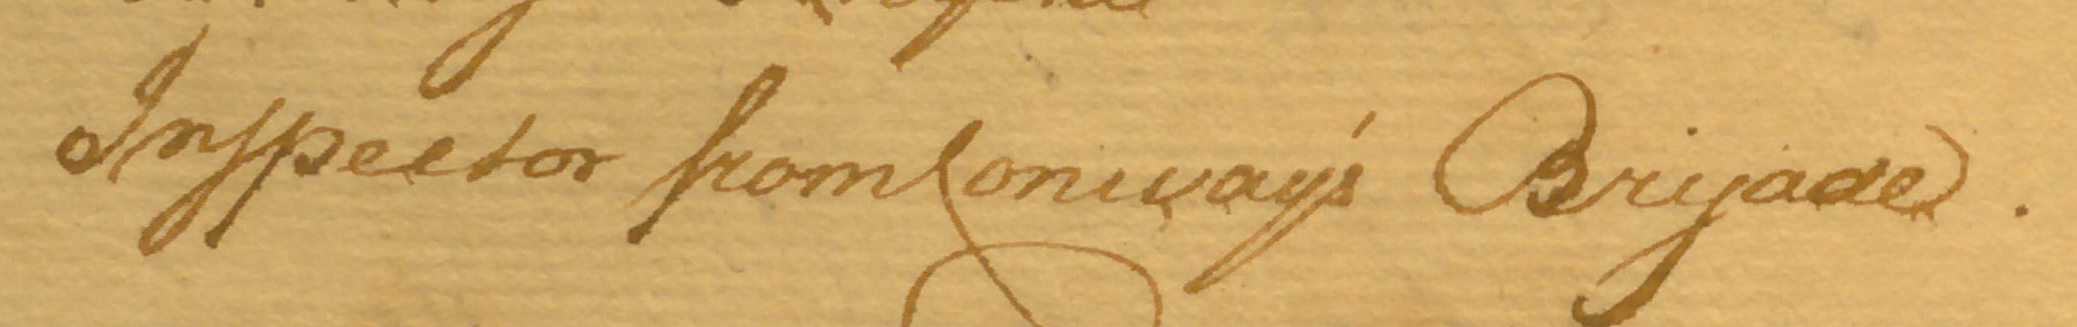Inspector from Conway's Brigade
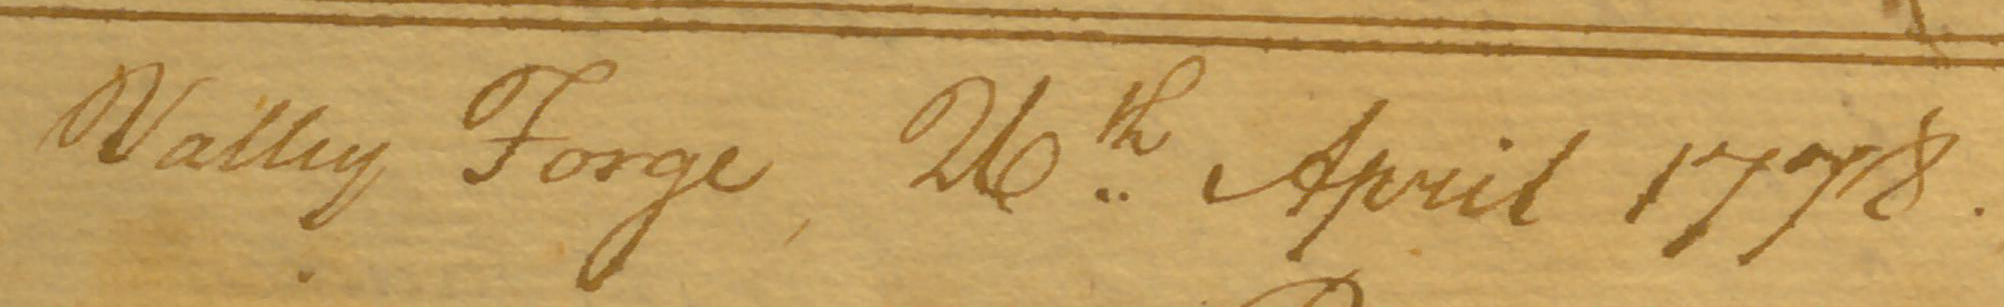Valley Forge 26^th. April 1778.
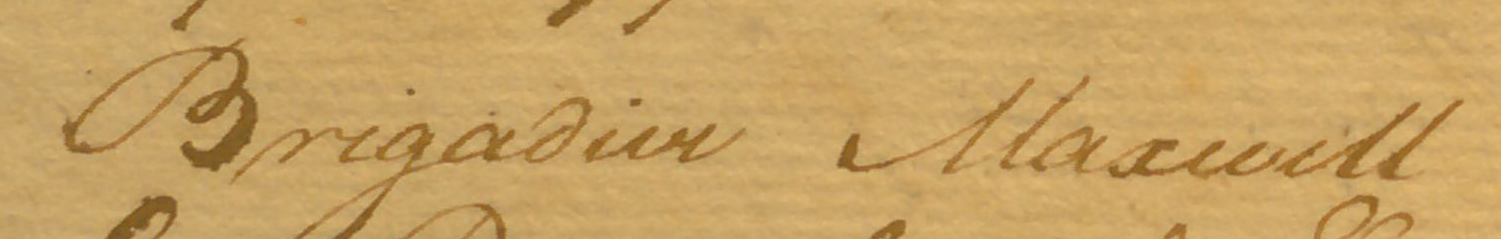Brigadier Maxwell
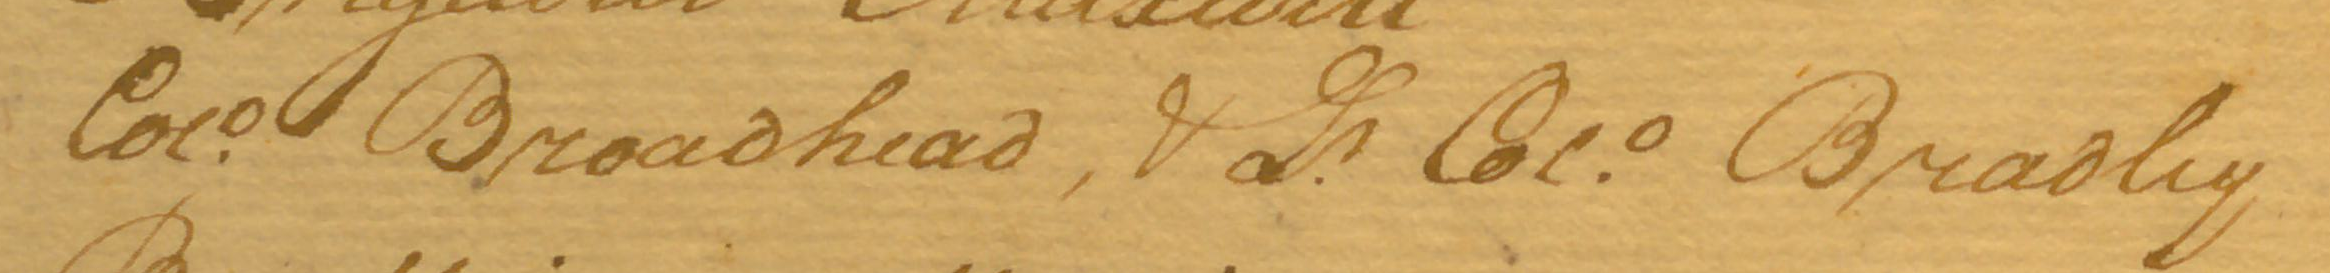Col^o. Broadhead, & L^t. Col^o. Bradley
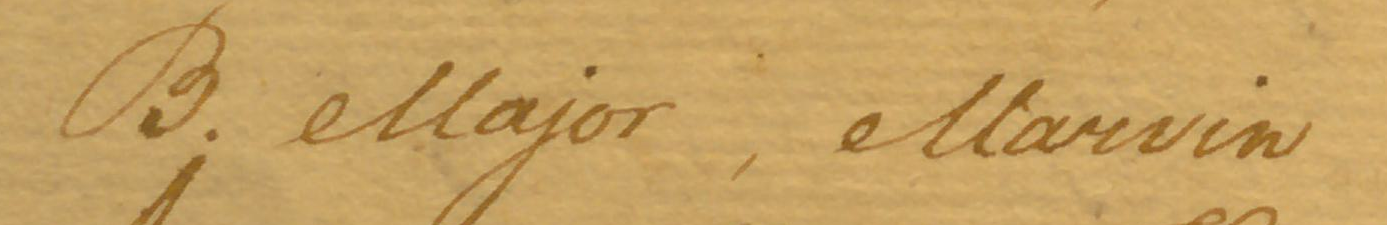B. Major Marvin
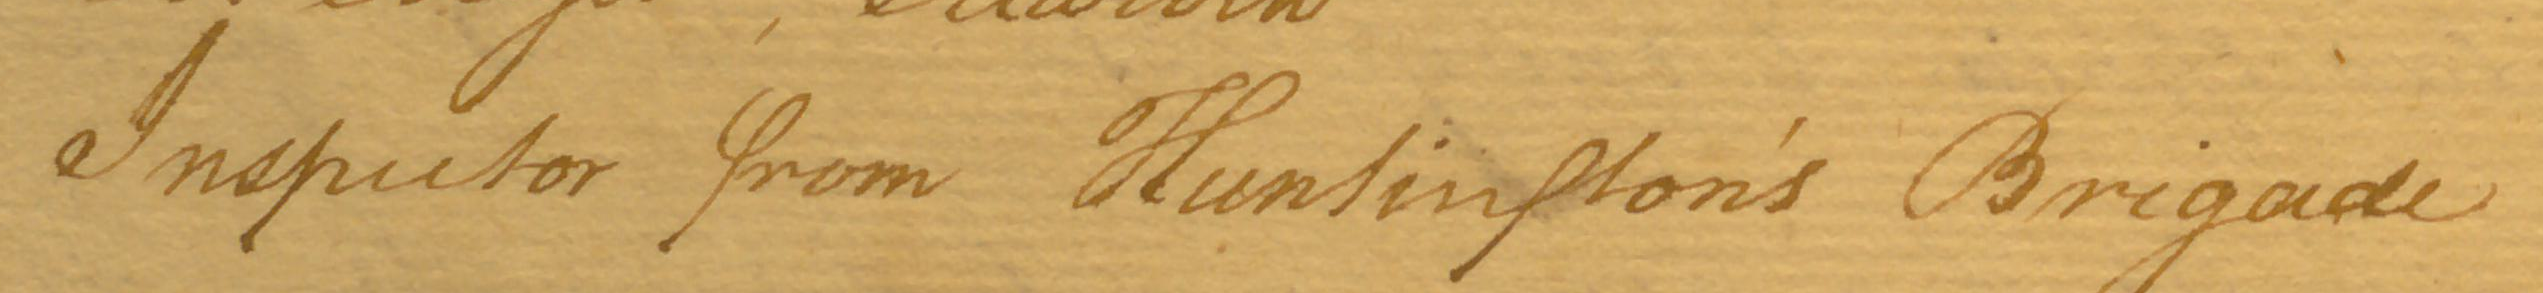Inspector from Huntington's Brigade
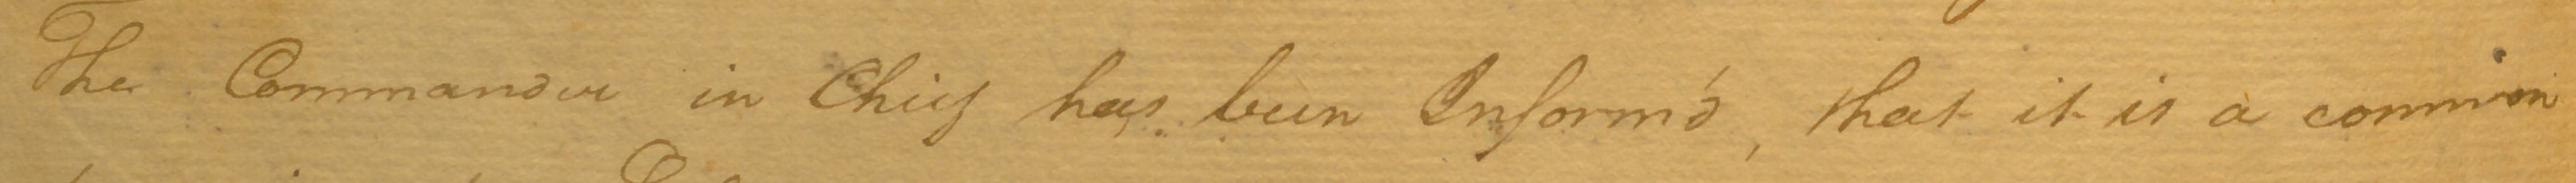The Commander in Chief has been Inform'd that it is a common
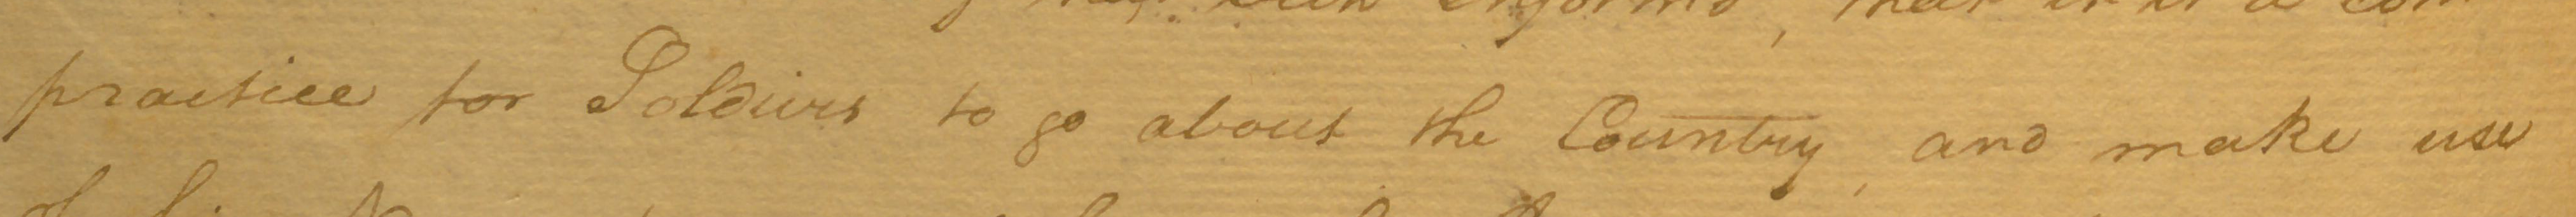practice for Soldiers to go about the Country and make use
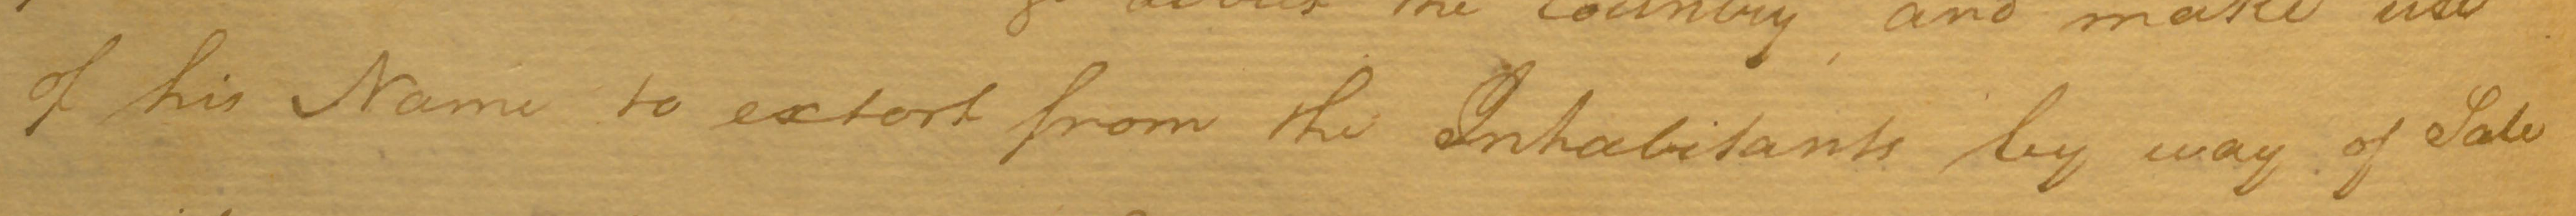of his Name to extort from the Inhabitants by way of Sale
